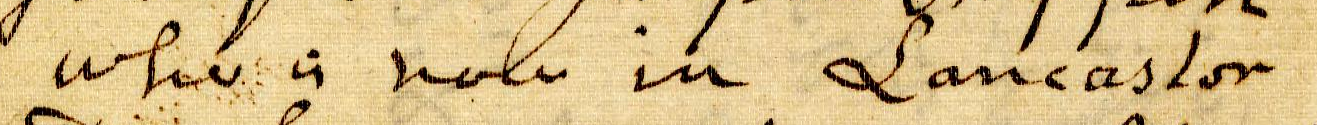who is now in Lancaster
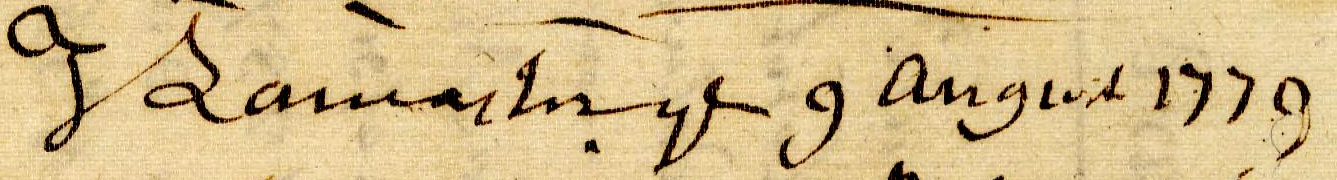Lancaster y^e 9 August 1779
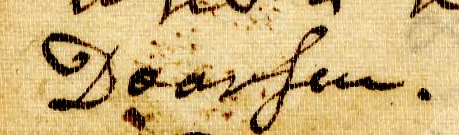Dear Son.
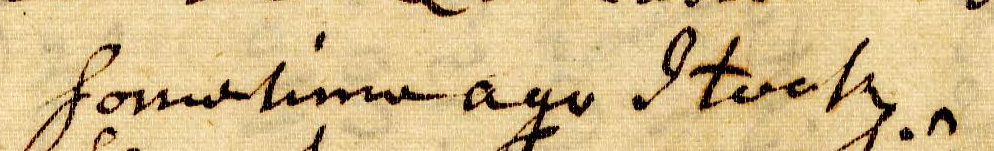Some time ago I took
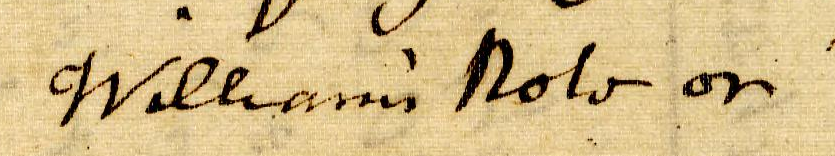Williams Note on
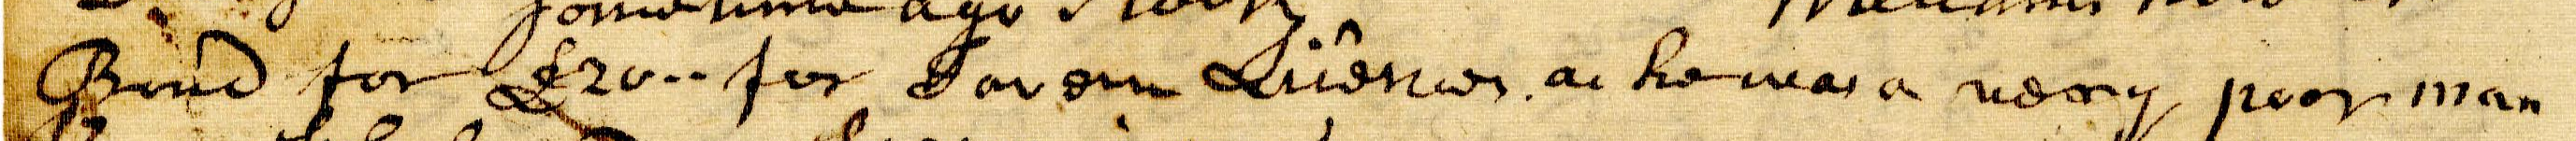Bond for £20.. Tavern Licenses as he was a very poor man
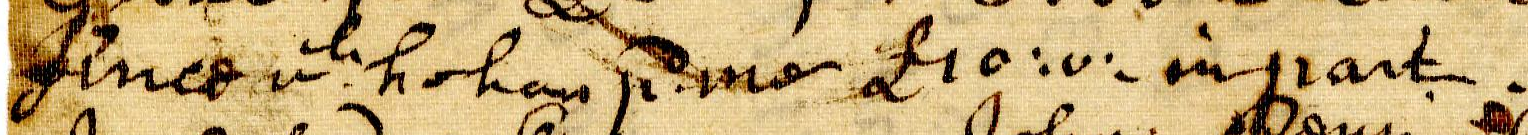since w^ch. he has p^d. me £10:0: in part
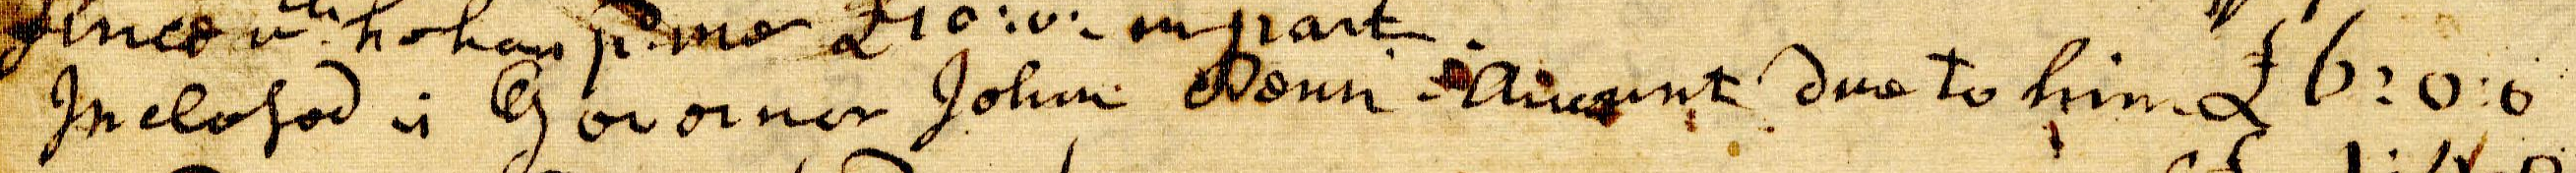Inclosed is Governor John Penn: Account due to him £6:0:0
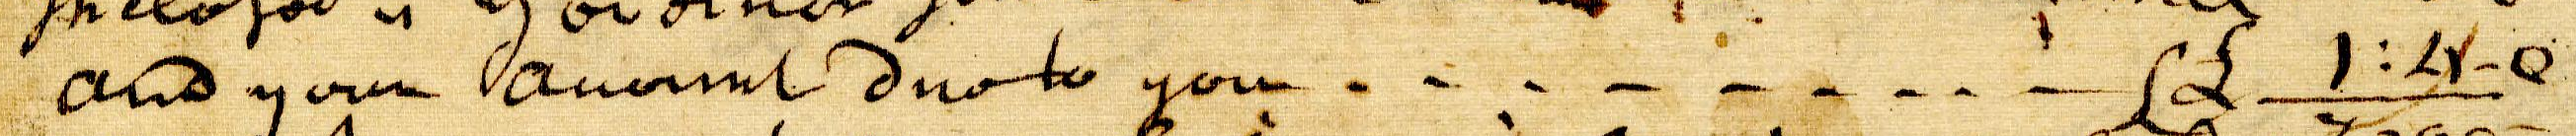And your Account due to you--------- £1:4.0
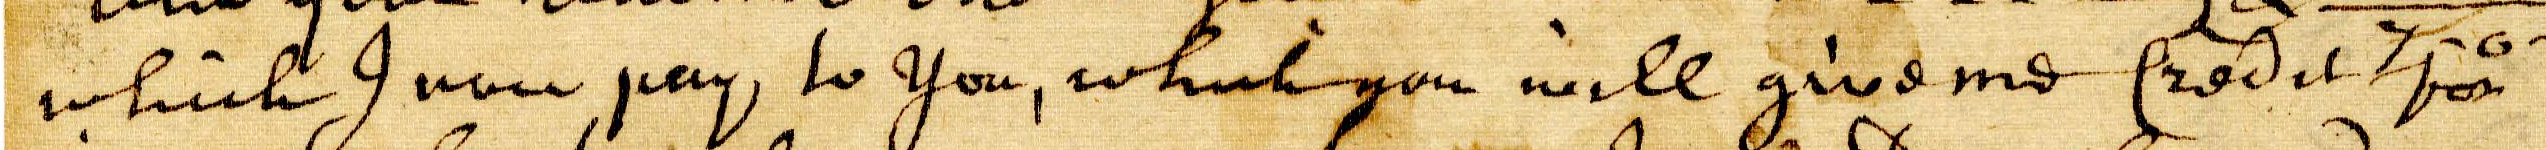which I now pay to You, which you will give me Credit for
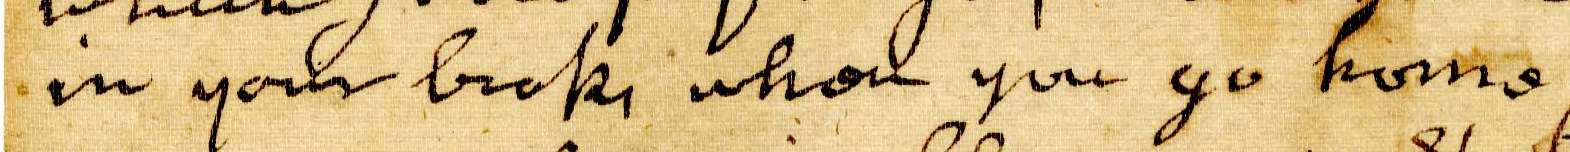in you books when you go home
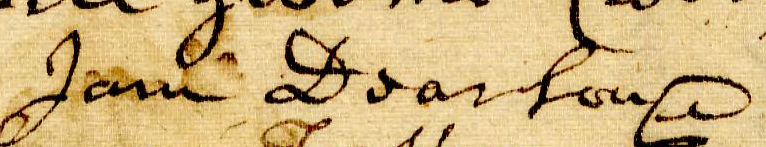I am Dear Son
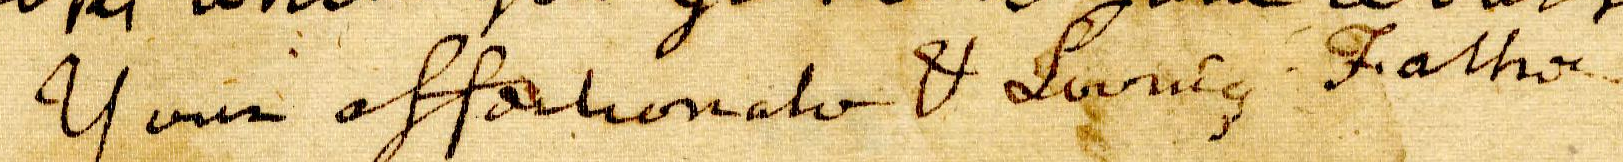Your affectionate & Loving Father
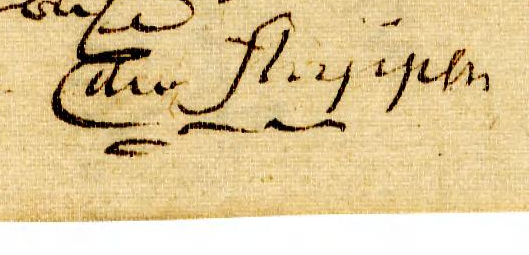Edw^d Shippen
